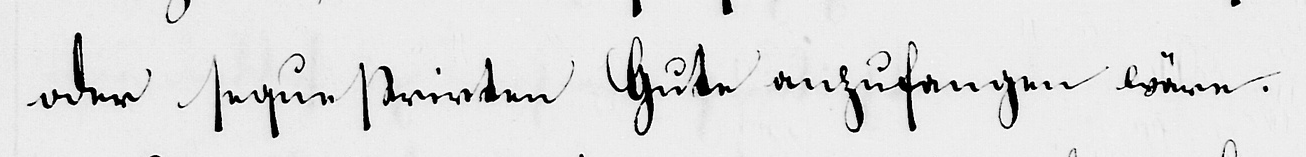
oder sequestrirten Gute anzufangen wäre.
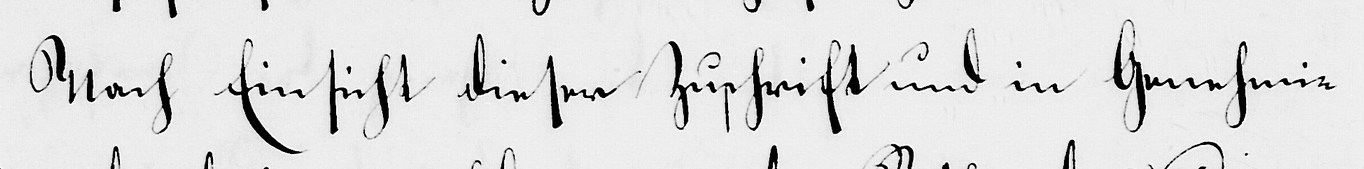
Nach Einsicht dieser Zuschrift und in Genehmi¬
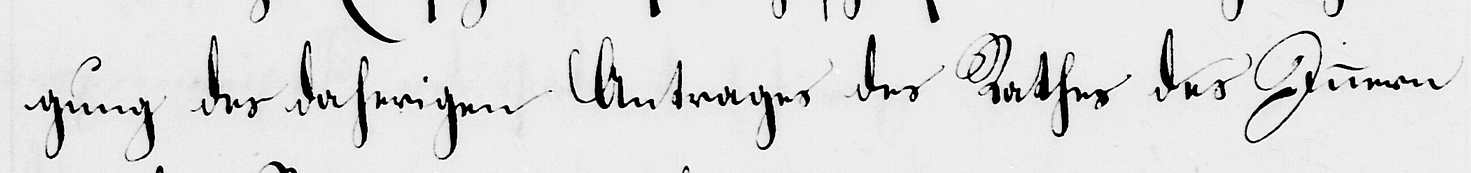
gung des daherigen Antrages des Rathes des Innern
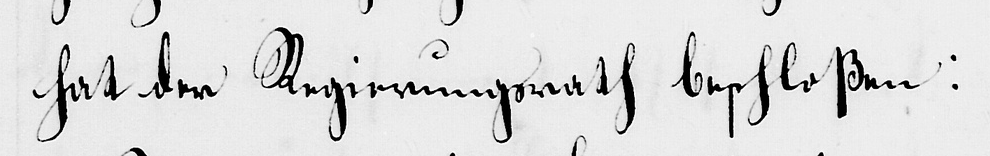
hat der Regierungsrath beschloßen:
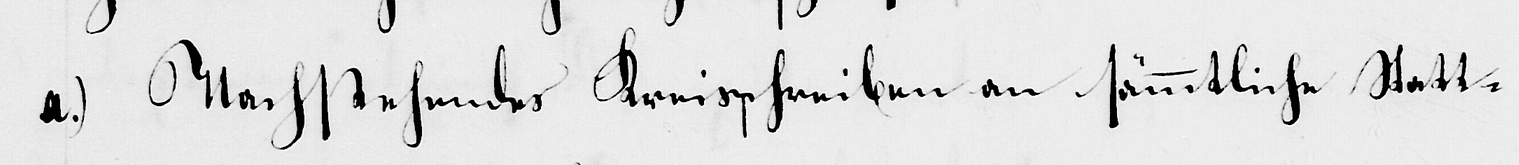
a.) Nachstehendes Kreisschreiben an sämmtliche Statt¬
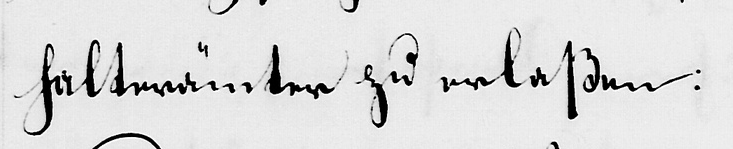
halterämter zu erlaßen:
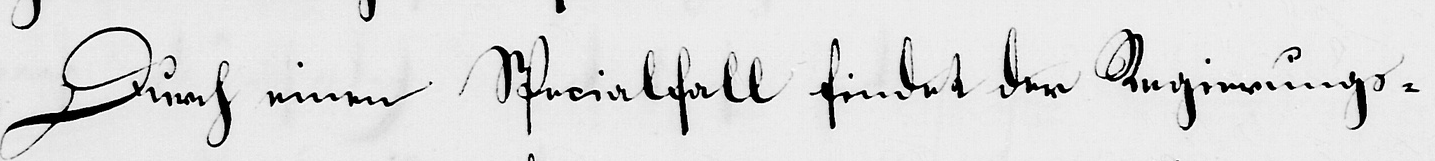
Durch einen Specialfall findet der Regierungs¬
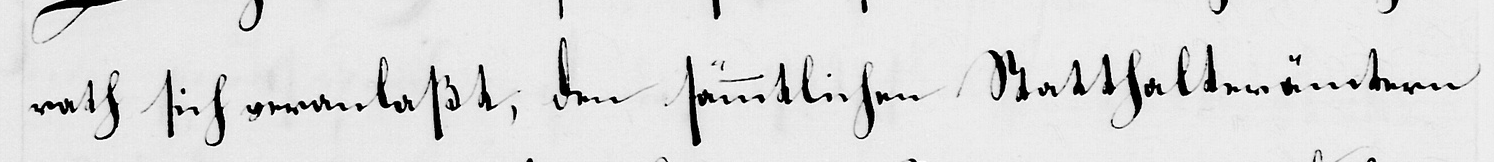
rath sich veranlaßt, den sämmtlichen Statthalterämtern
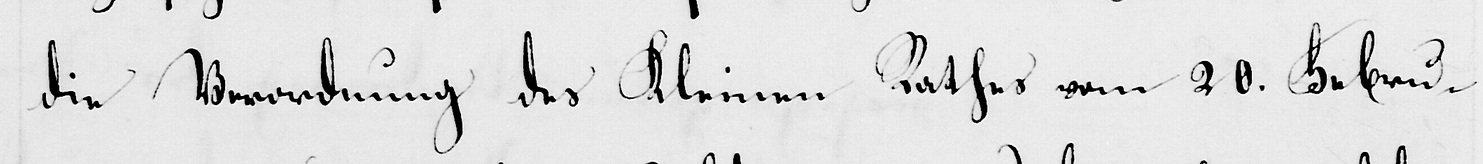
die Verordnung des Kleinen Rathes vom 20. Febru¬
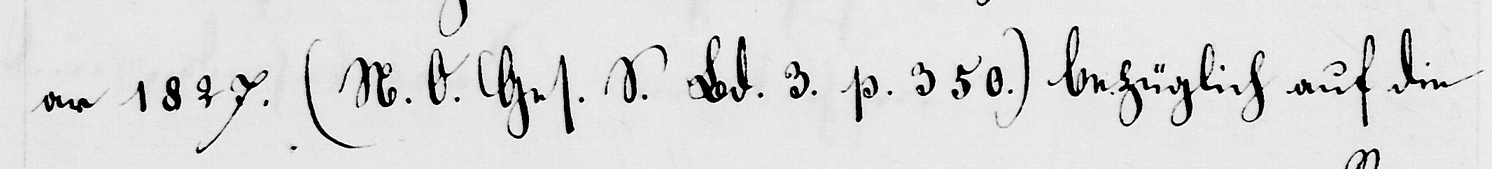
ar 1827. (N. O. Ges. S. Bd. 3. p. 350.) bezüglich auf die
